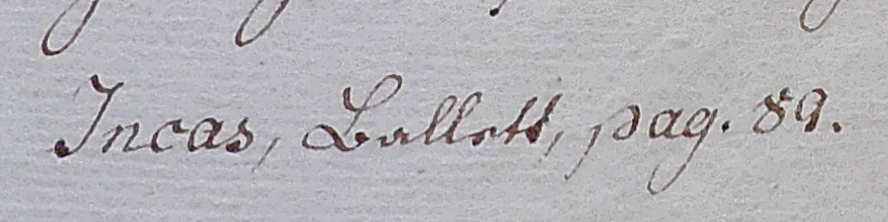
Incas, Ballett, pag. 89.
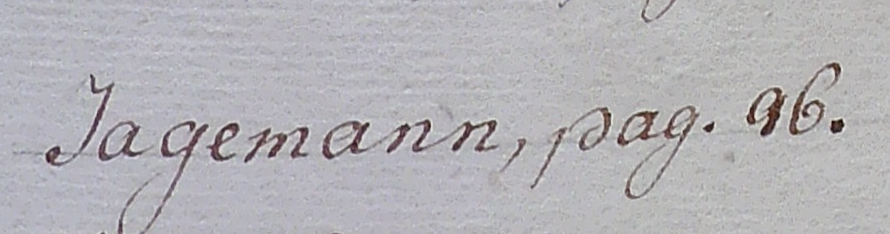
Jagemann, pag. 96.
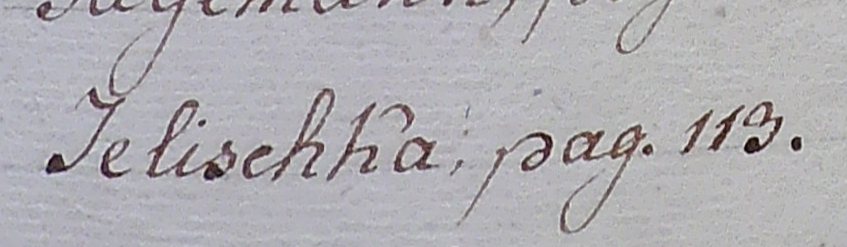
Jelischka, pag. 113.
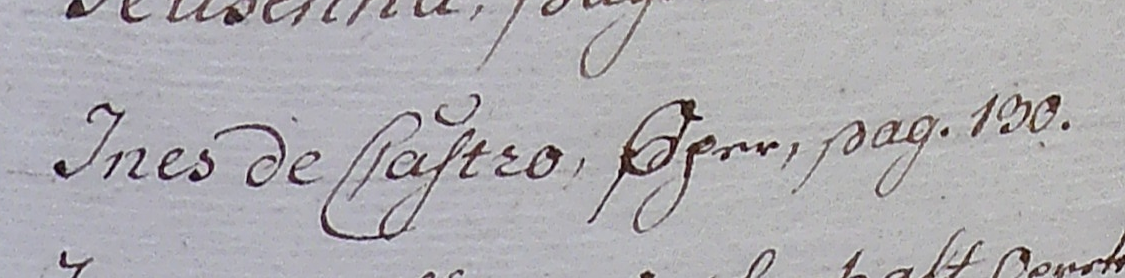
Ines de Castro, Oper, pag. 130.
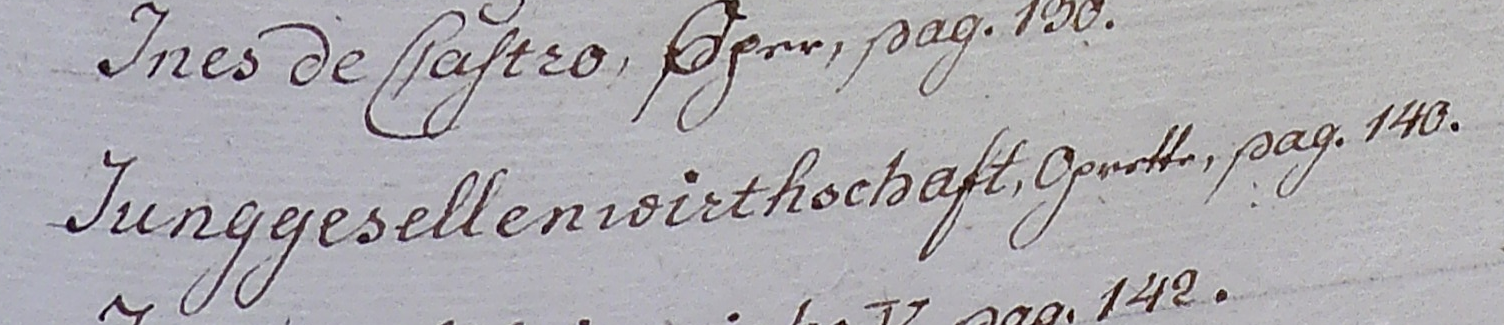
Junggesellenwirthschaft, Oprette, pag. 140.
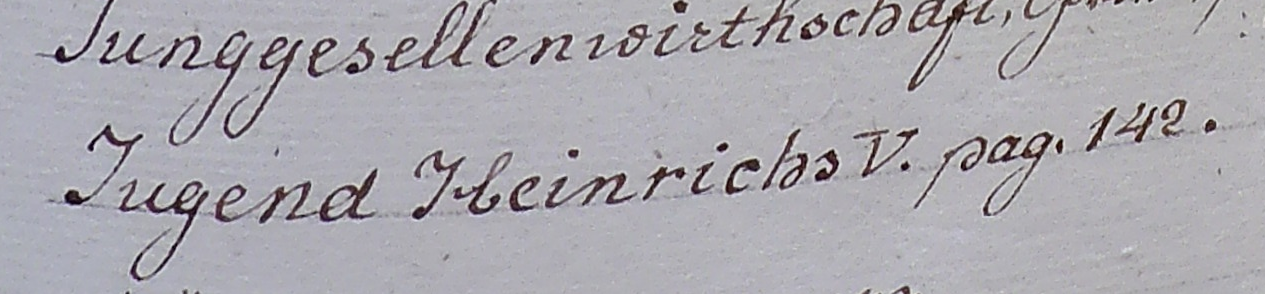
Jugend Heinrichs V. pag. 142.
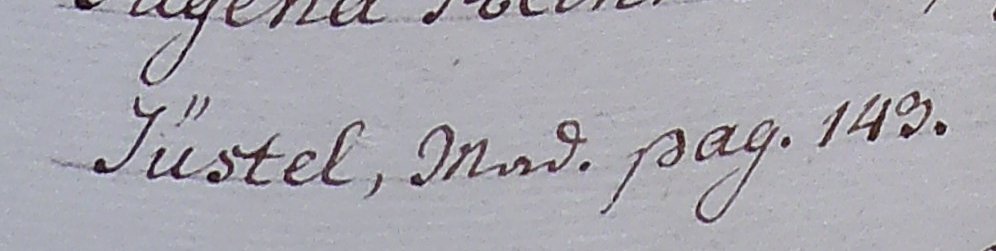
Jüstel, Mad. pag. 143.
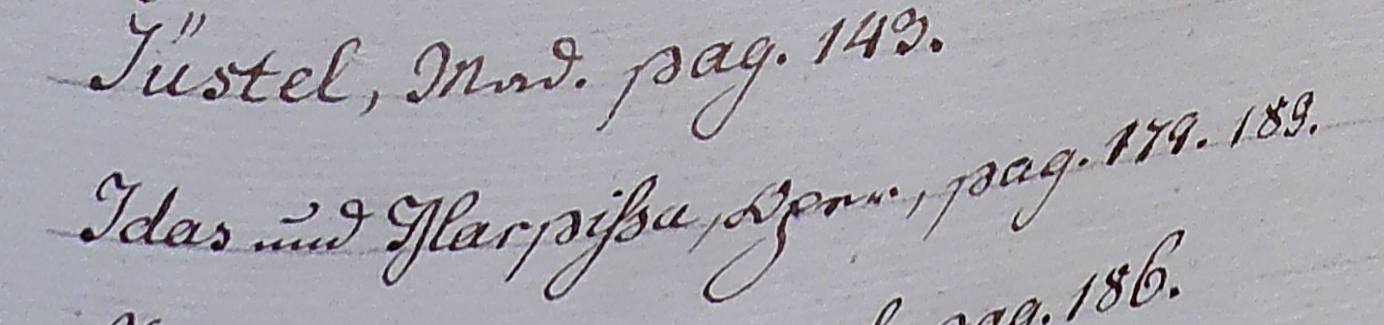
Idas und Marpissa, Oper, pag, 179. 189.
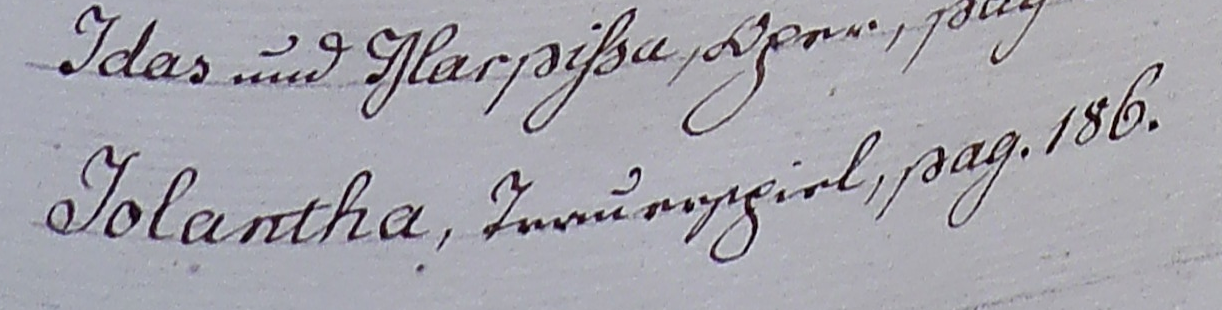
Jolantha, Trauerspiel, pag. 186.
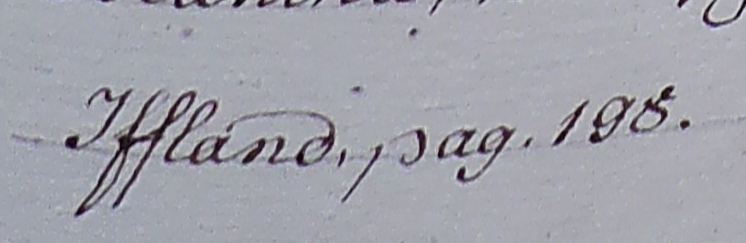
Iffland, pag. 198.
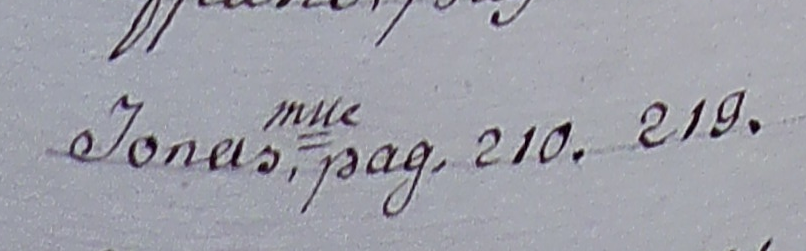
Jonas,Mll̳epag. 210. 219.
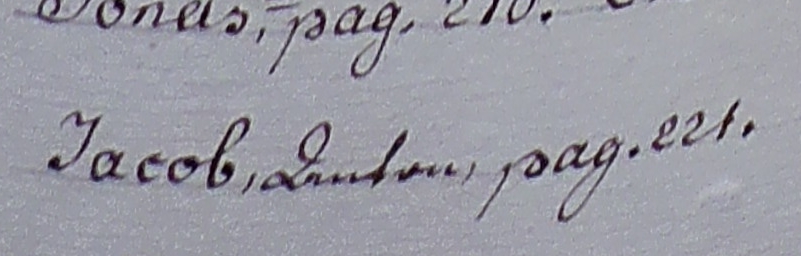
Jacob, Anton, pag. 221.
